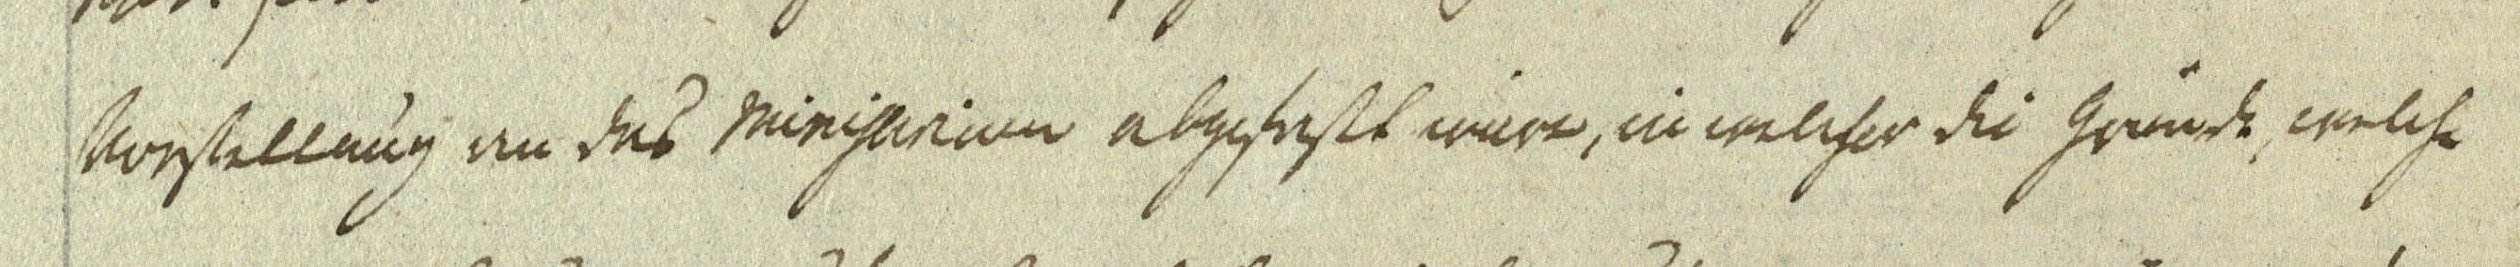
Vorstellung an das Ministerium abgefaßt wäre, in welcher die Gründe, welche
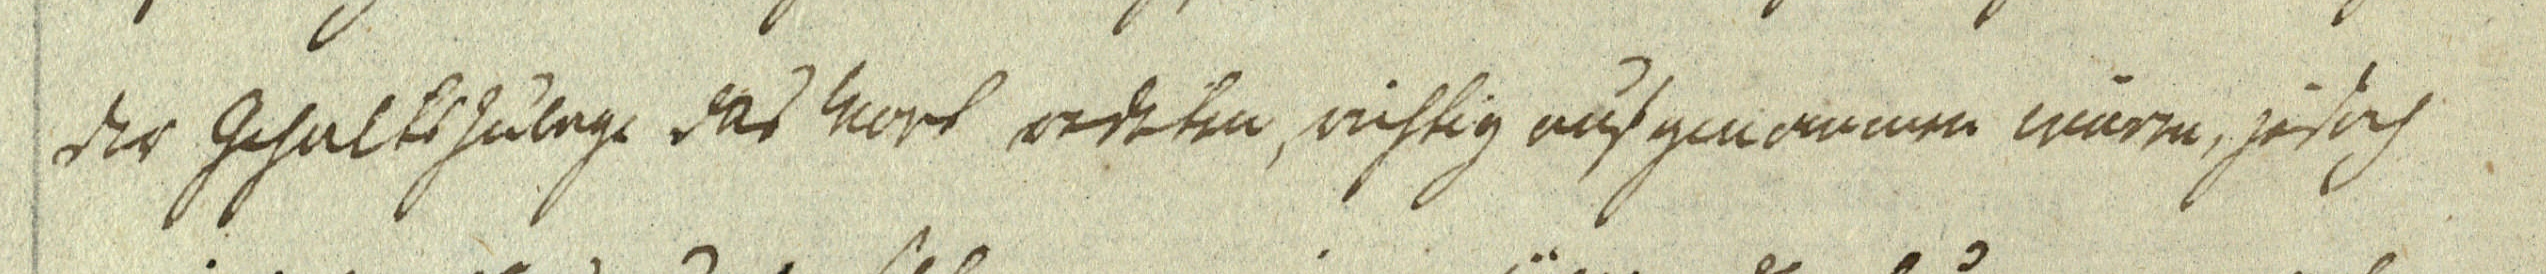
der Gehaltszulage das Wort redeten, richtig auf genommen wären, jedoch
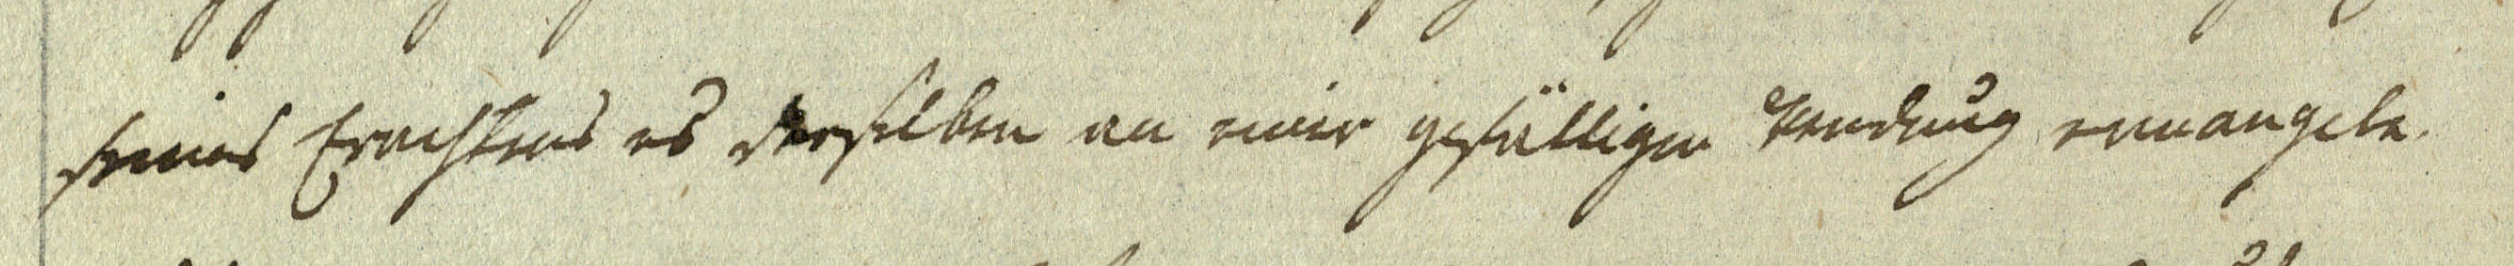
seines Erachtens es derselben an einer gefälligen Wendung ermangele.
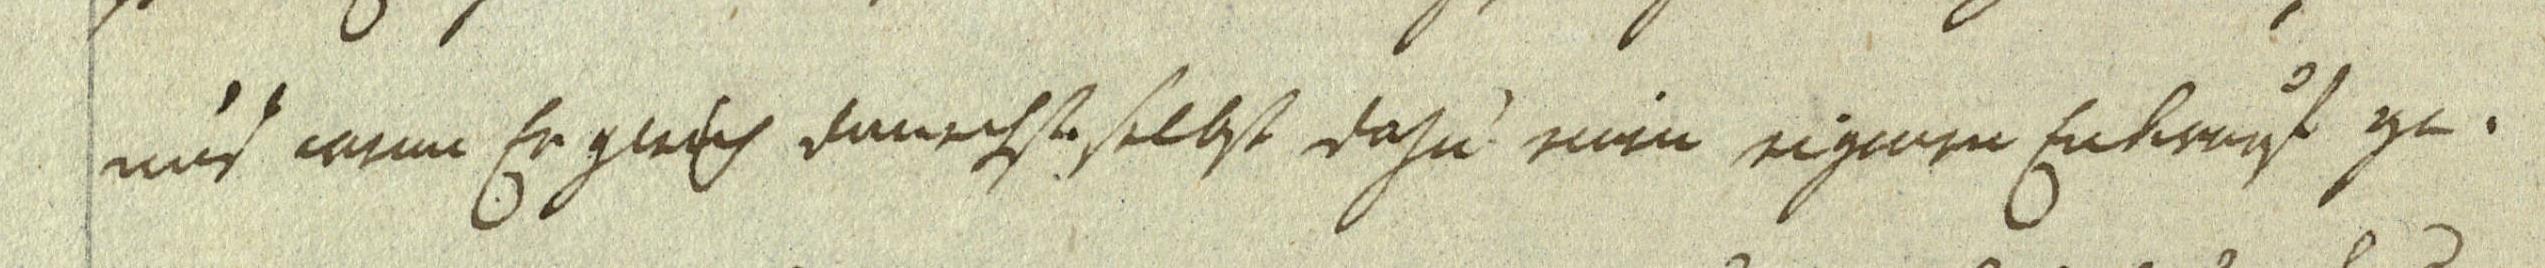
und wenn Er gleich danechste selbst dazu einen eigenen Entwurf ge¬
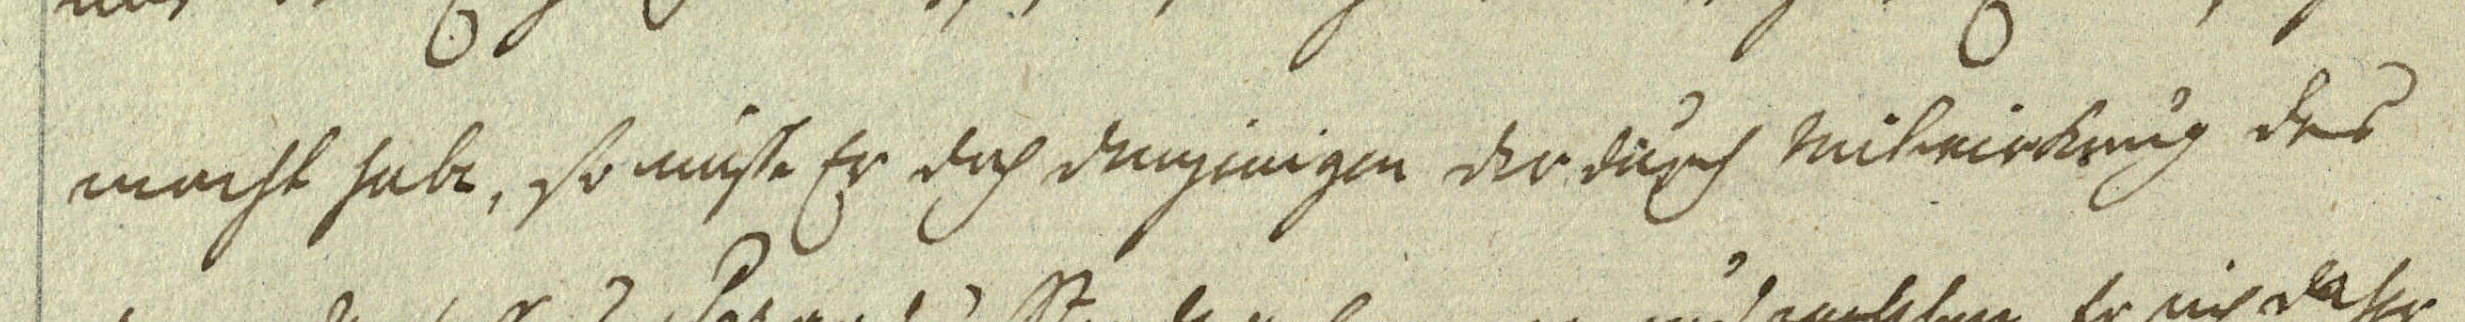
macht habe, so müsse Er doch demjenigen der durch Mitwirkung des
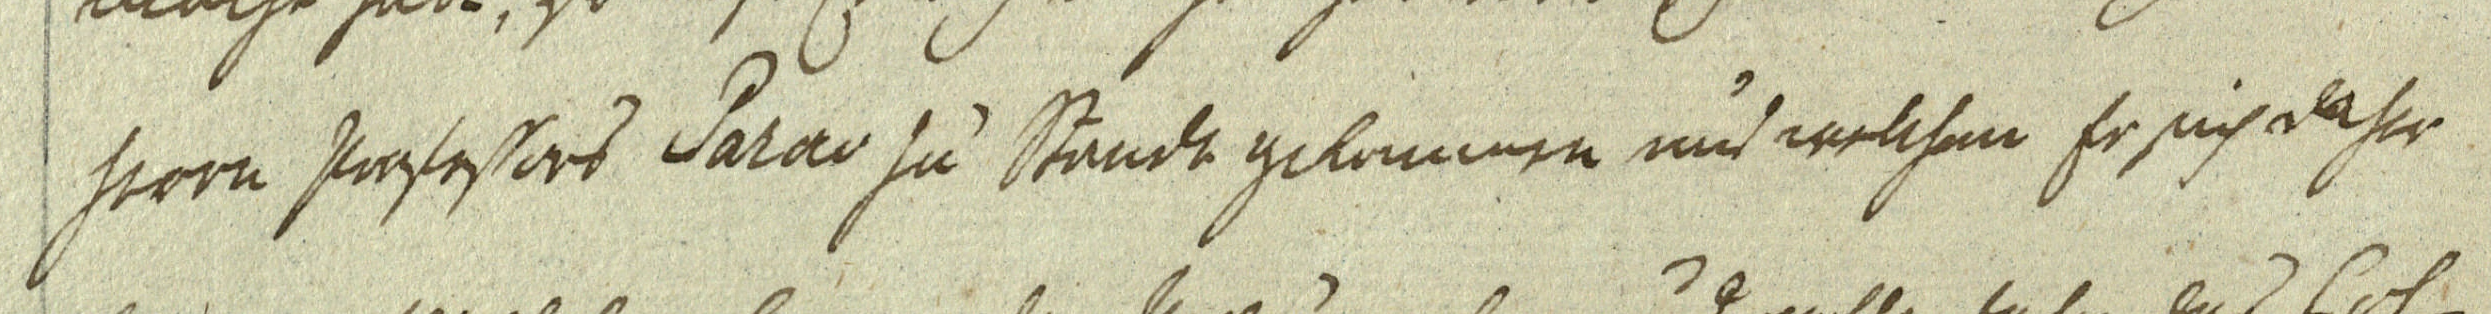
Herrn Professors Parow zu Stande gekommen und welchem Er sich daher
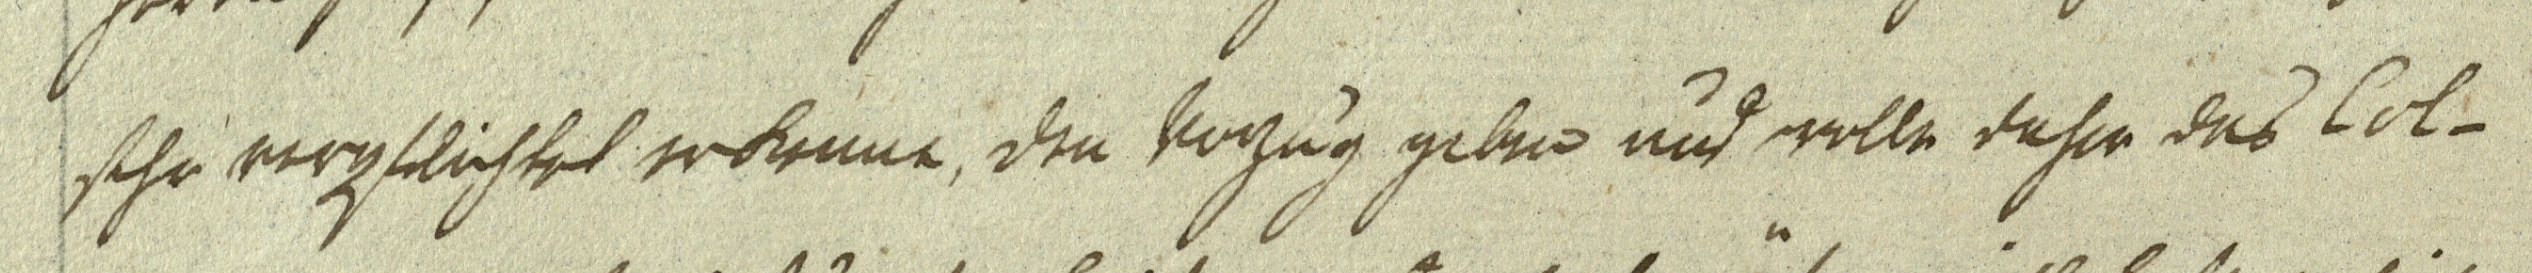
sehr verpflichtet erkenne, den Vorzug geben und wolle daher das Col¬
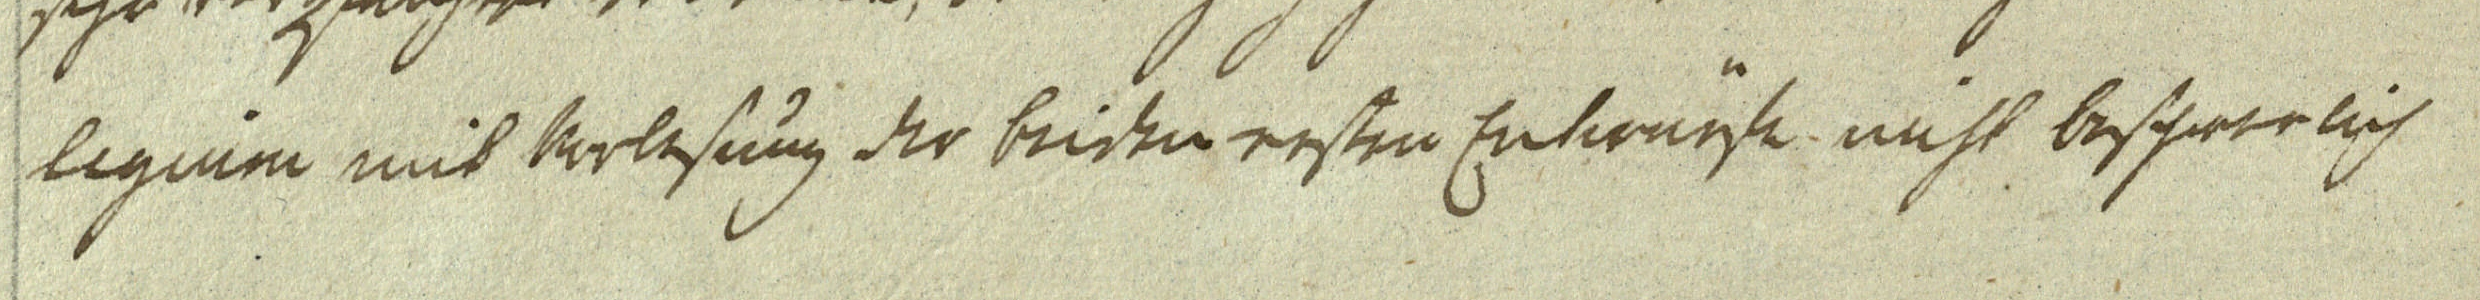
legium mit Verlesung der beiden ersten Entwürfe nicht beschwerlich
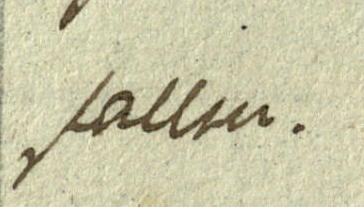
fallen.
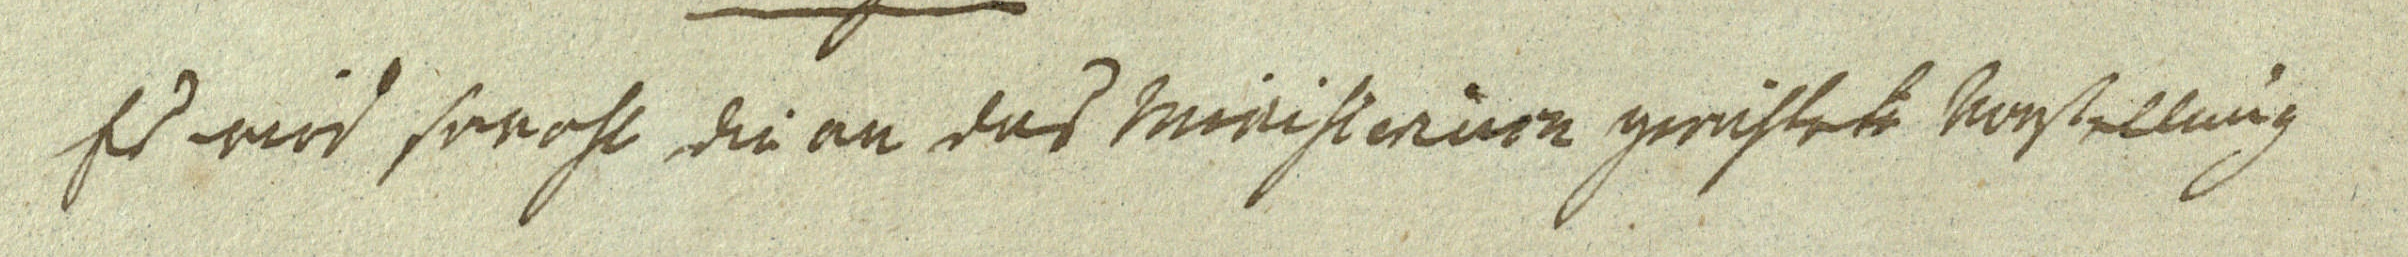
Es wird sowohl die an das Ministerium gerichtete Vorstellung
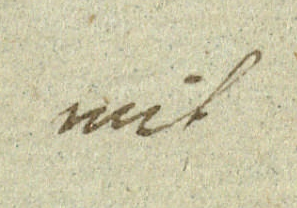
mit
